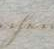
machen.
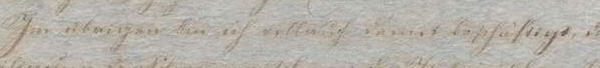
Im übrigen bin ich vollauf damit beschäftigt, die
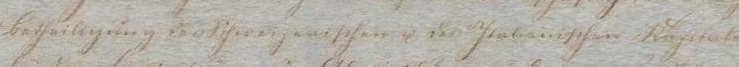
Betheiligung des Schweizerischen & des Italienischen Kapitales
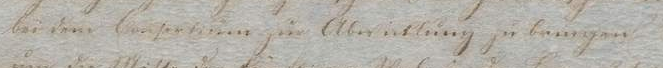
bei dem Consortium zur Abwicklung zu bringen.
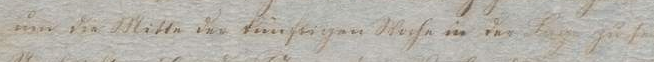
um die Mitte der künftigen Woche in der Lage zu sein,
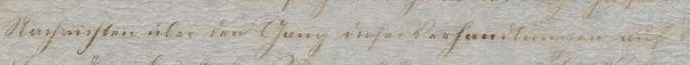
Nachrichten über den Gang dieser Verhandlungen auf
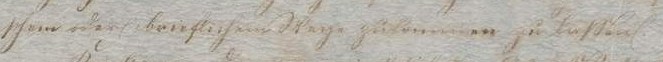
schem oder brieflichem Wege zukommen zu lassen.
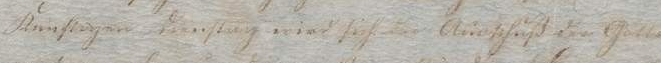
Künftigen Dienstag wird sich der Ausschuß der Gottvereinig
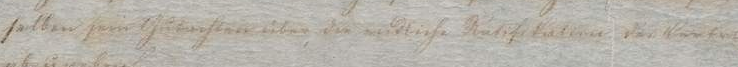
selben sein Gutachten über die endliche Ratifikation des Vertrages
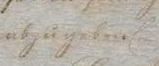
abzugeben.
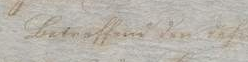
Betreffend den definitiven
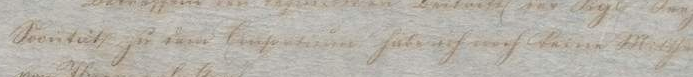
Societät zu dem Consortium habe ich noch keine Mittheilungen
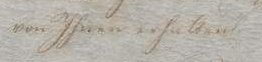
von Ihnen erhalten.
